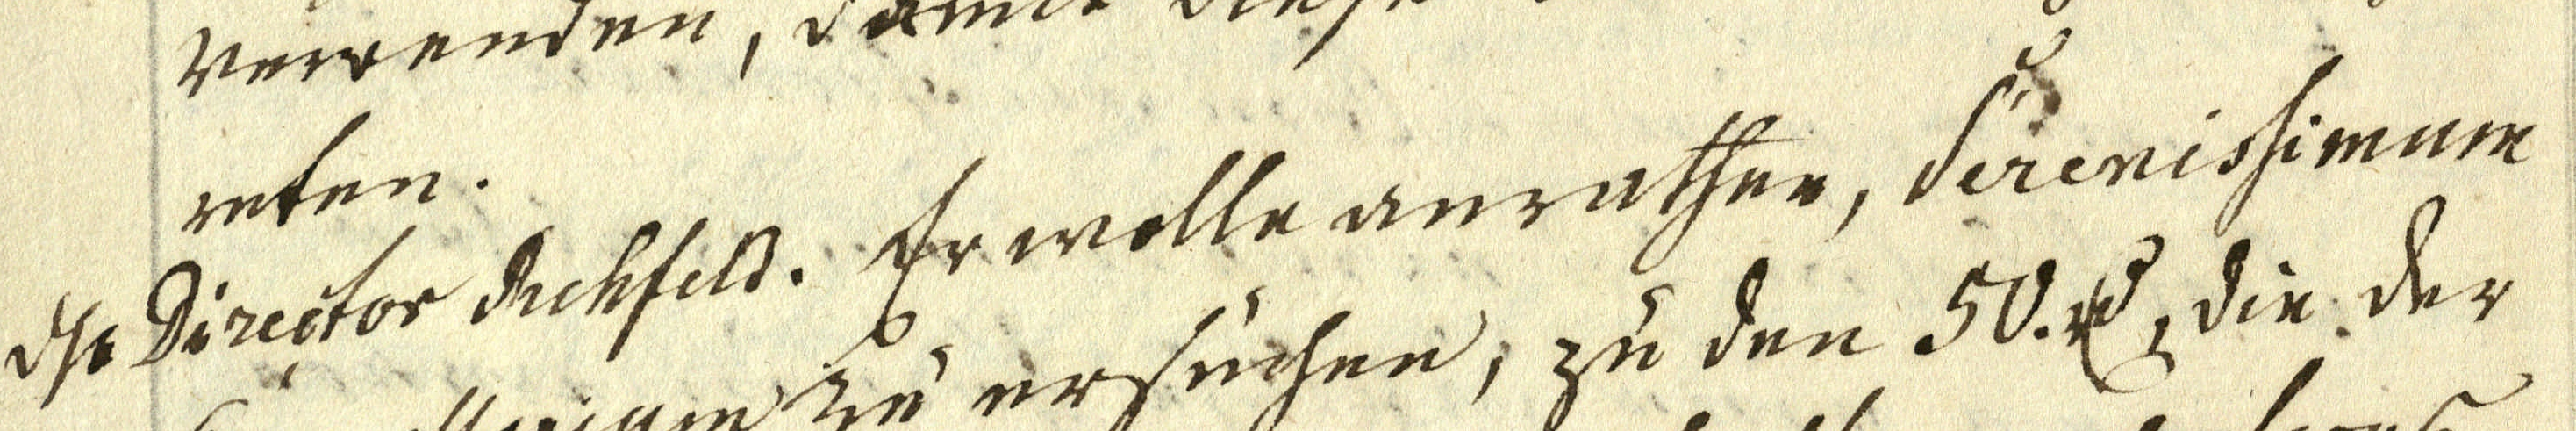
dh. Director Rehfeld. Er wolle anrathen, Serenissimum
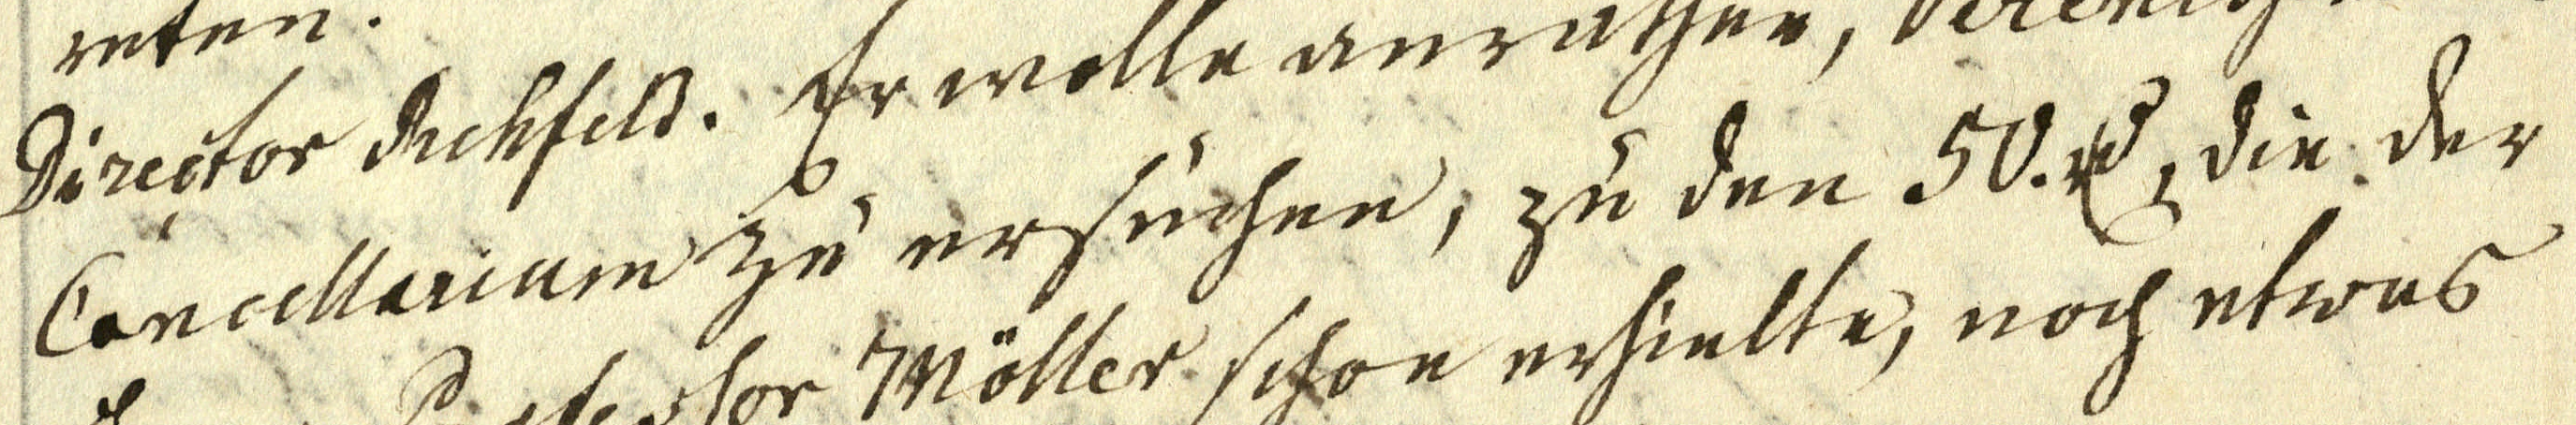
Cancellarium zu ersuchen, zu den 50. r, die der
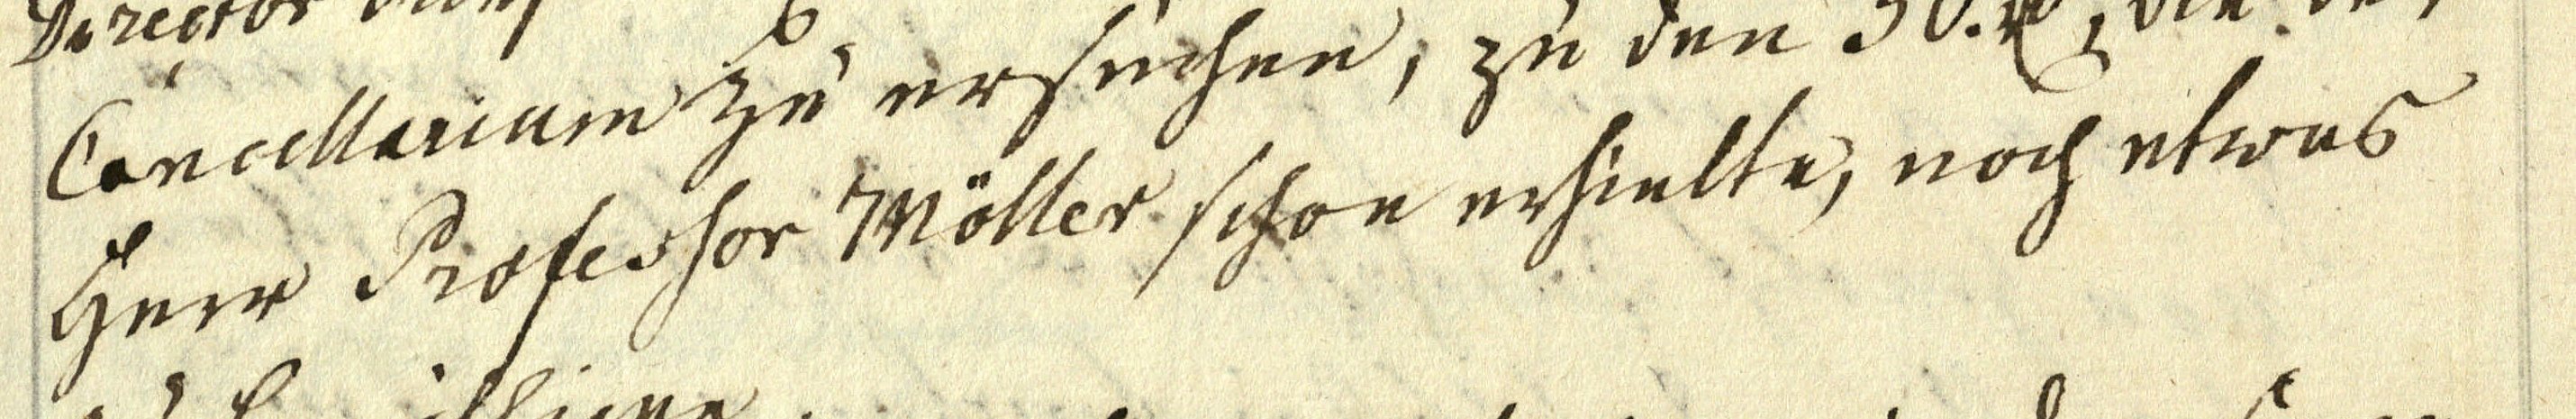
Herr Professor Möller schon erhielte, noch etwas
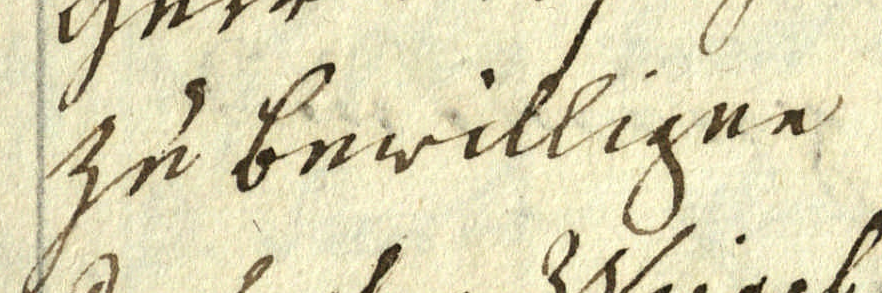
zu bewilligen.
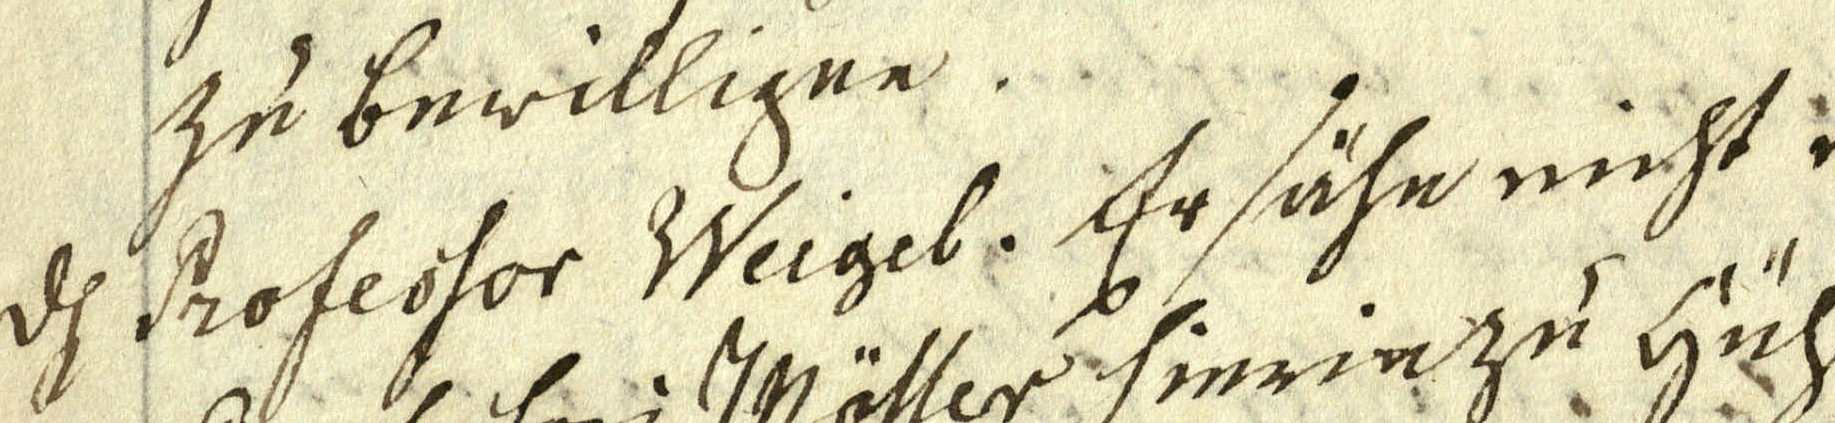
dh Professor Weigel. Er sähe nicht ein, wie dem Herrn
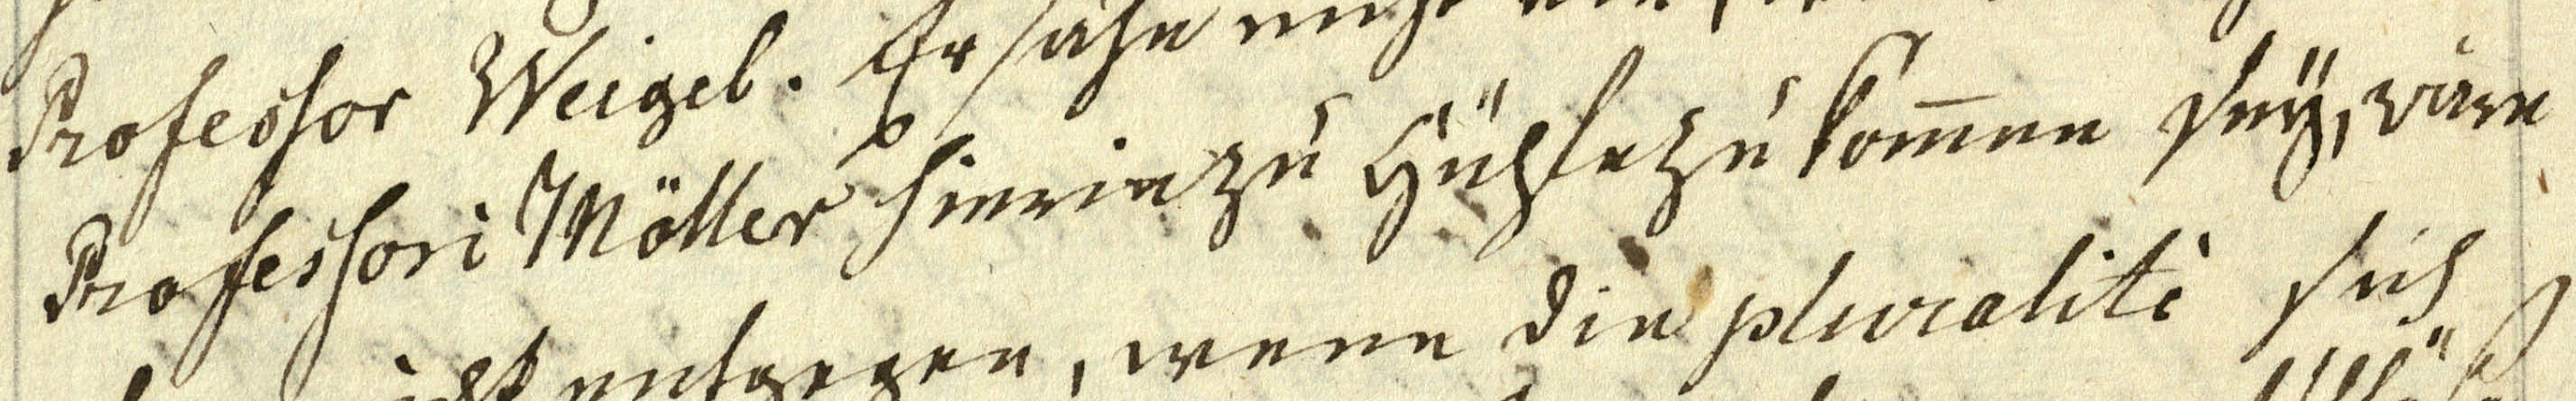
Professori Möller hierin zu Hülfe zu komen seÿ, wäre
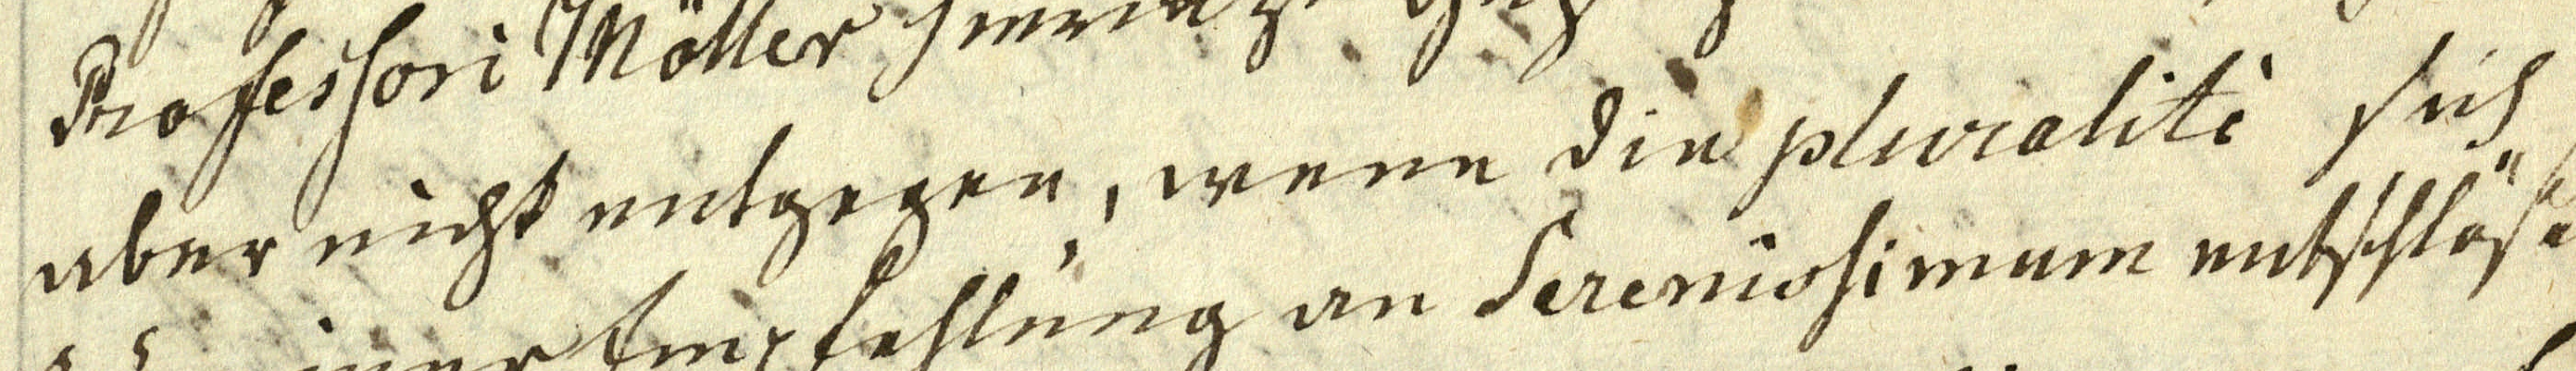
aber nicht entgegen, wenn die pluralite sich
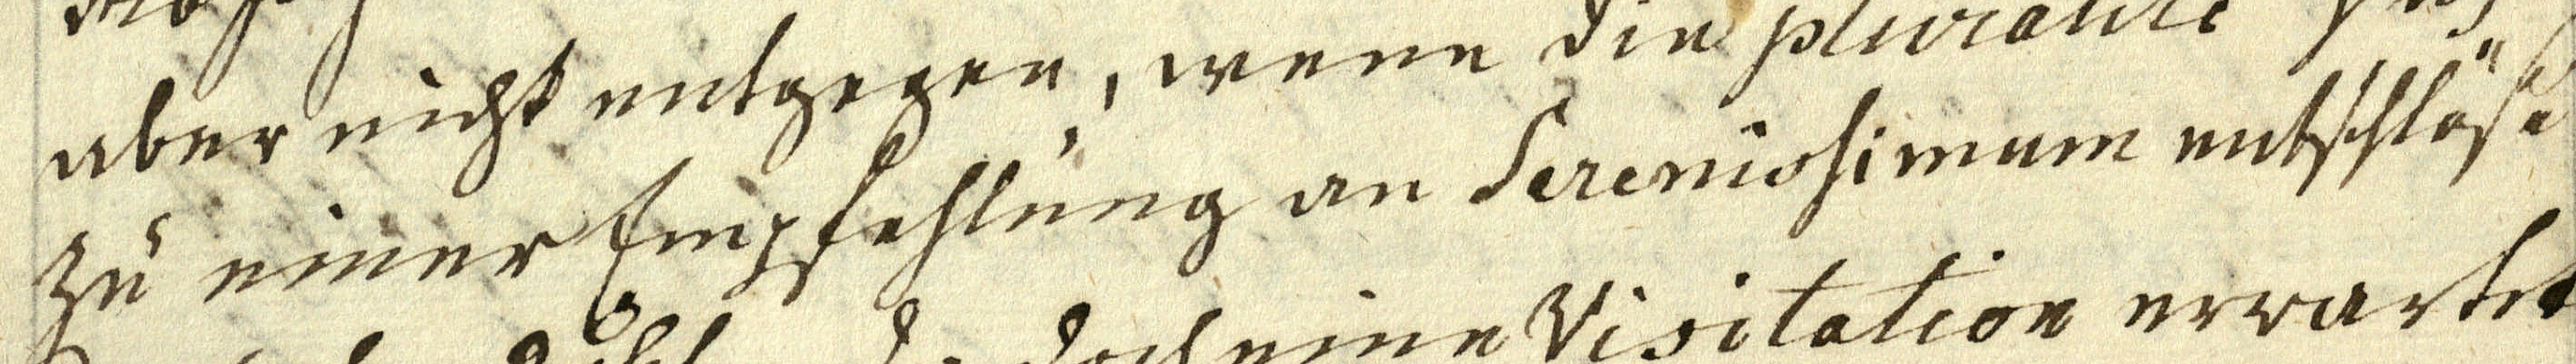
zu einer Empfehlung an Serenissimum entschlöße
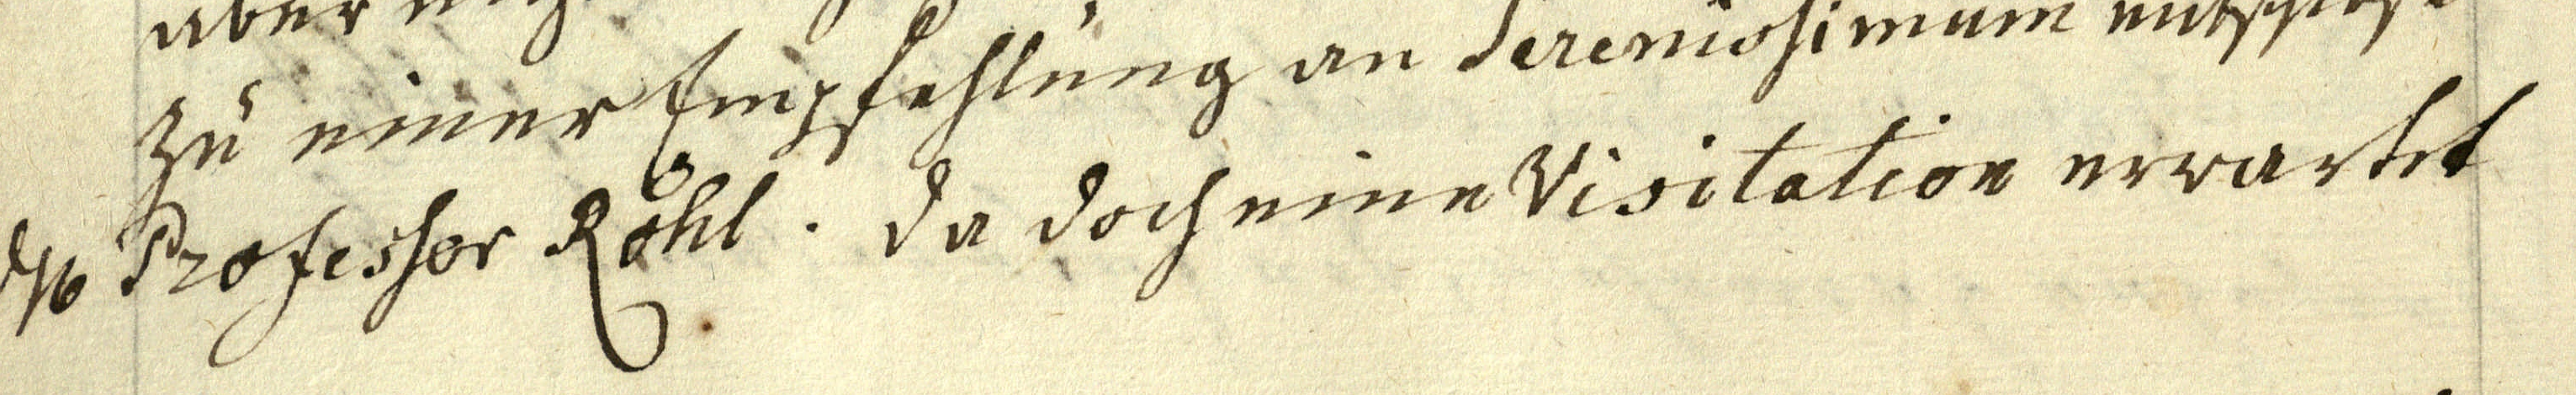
dh Professor Röhl. Da doch eine Visitation erwartet
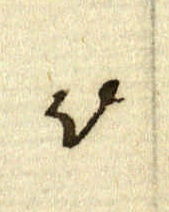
w
